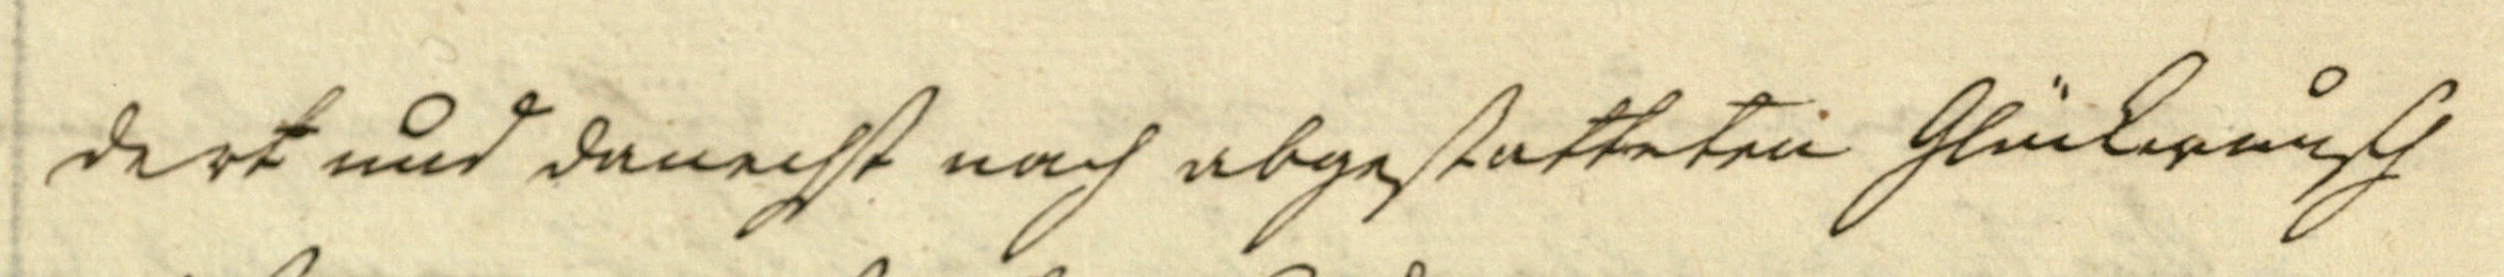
dert und danechst nach abgestatteten Glückwunsch
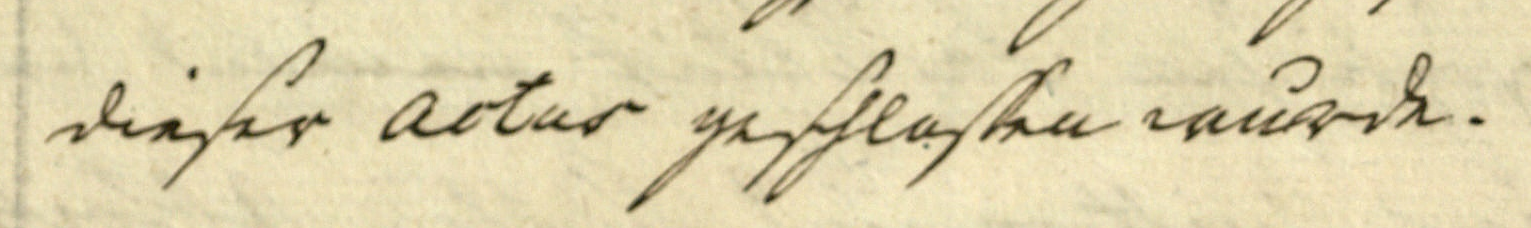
dieser actus geschlossen wurde.
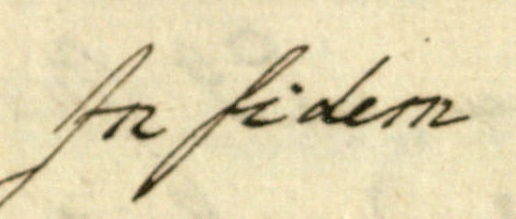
In fidem
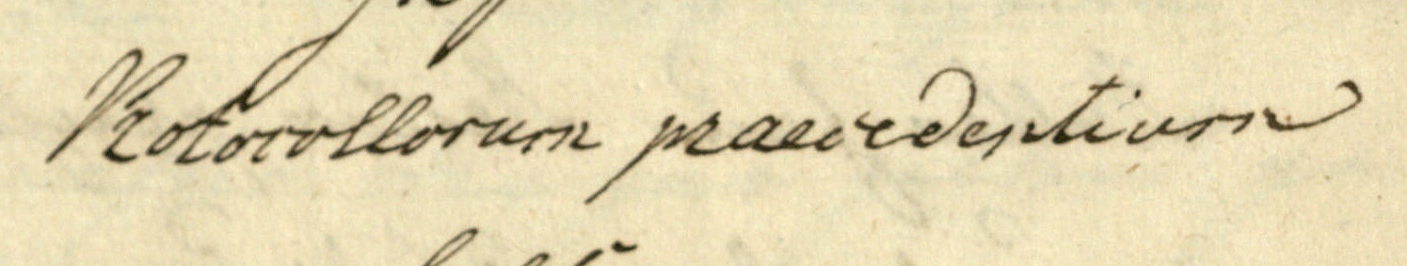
Protocollorum praecedentium
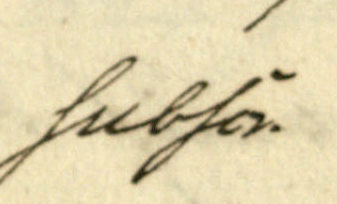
subscr.
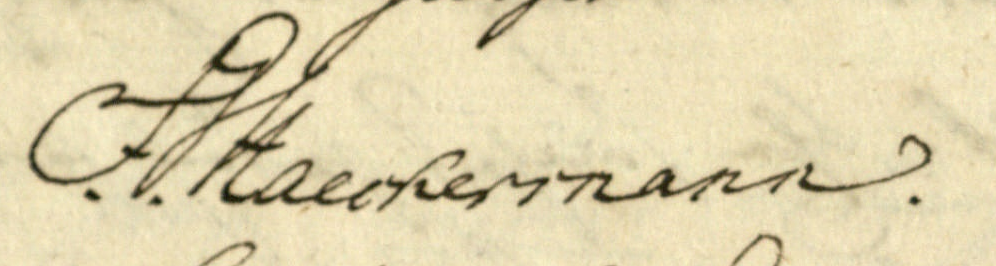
F.G. Haeckermann.
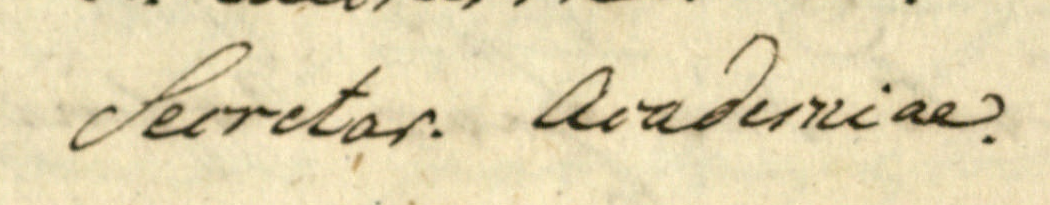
Secretar. Academiae.
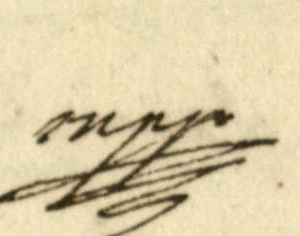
mpp.
